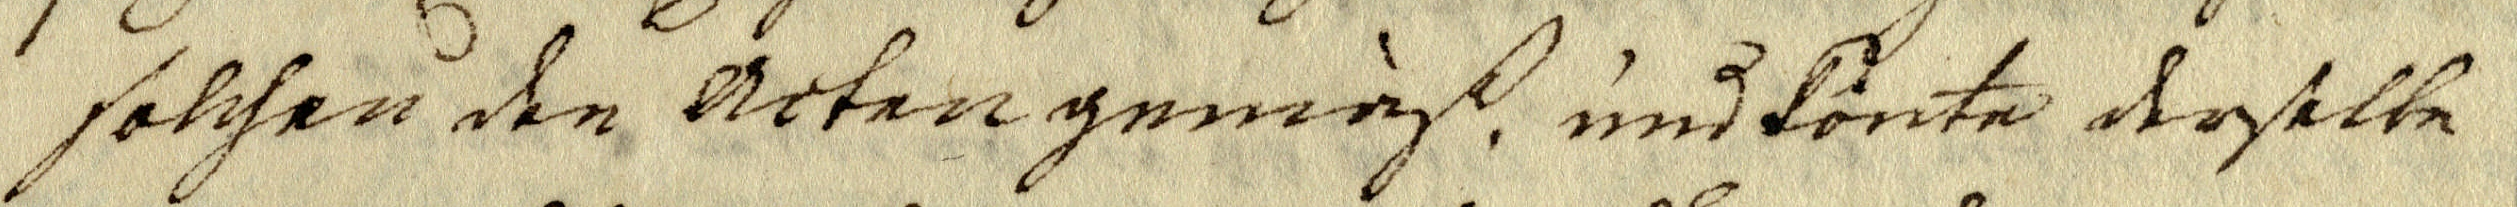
solchen den Acten gemäß und könte derselbe
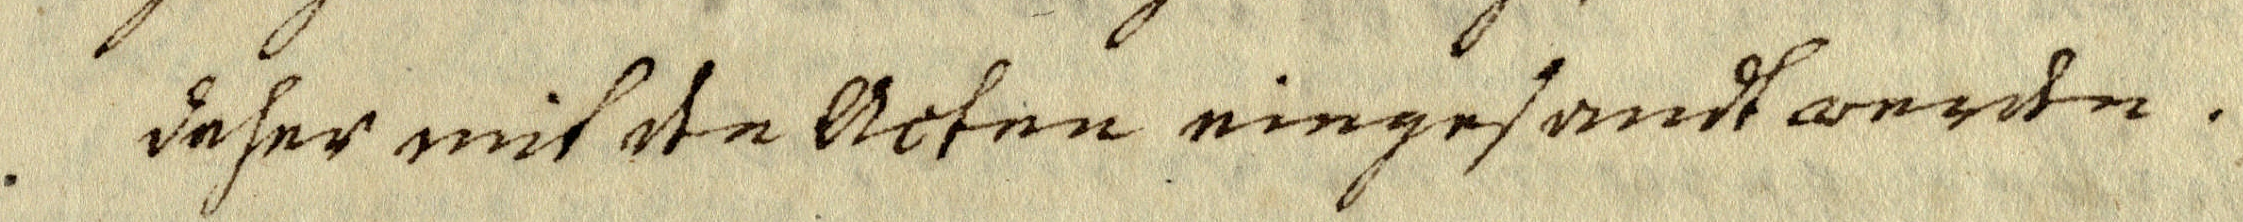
daher mit den Acten eingesandt werden.
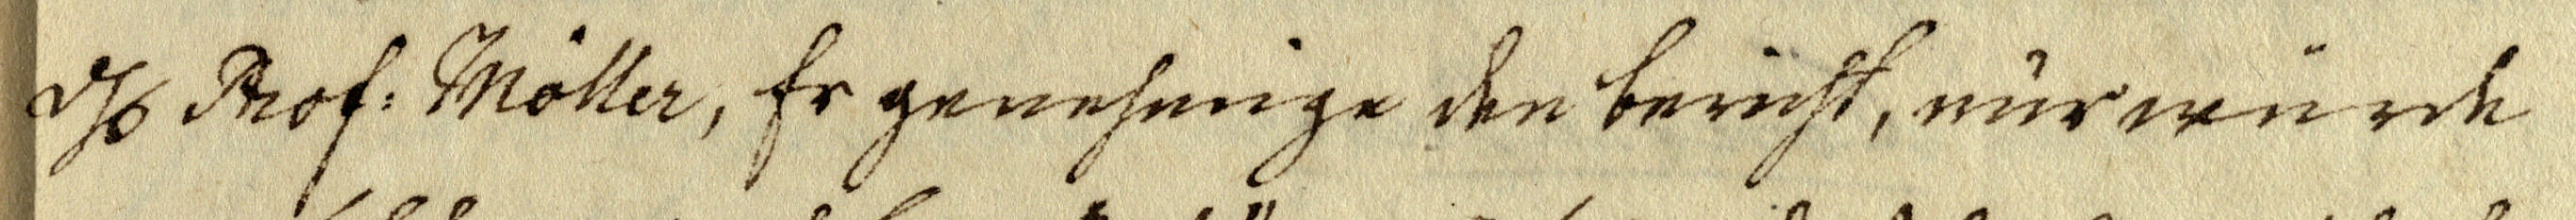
dh Prof. Möller, Er genehmige den Bericht, nur würde
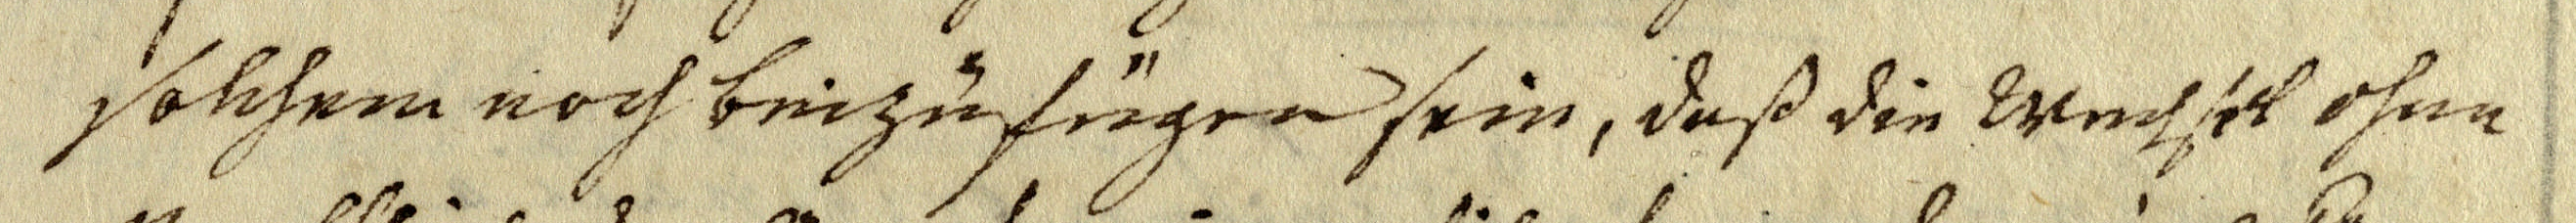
solchem noch beizufügen sein, daß die Wechsel ohne
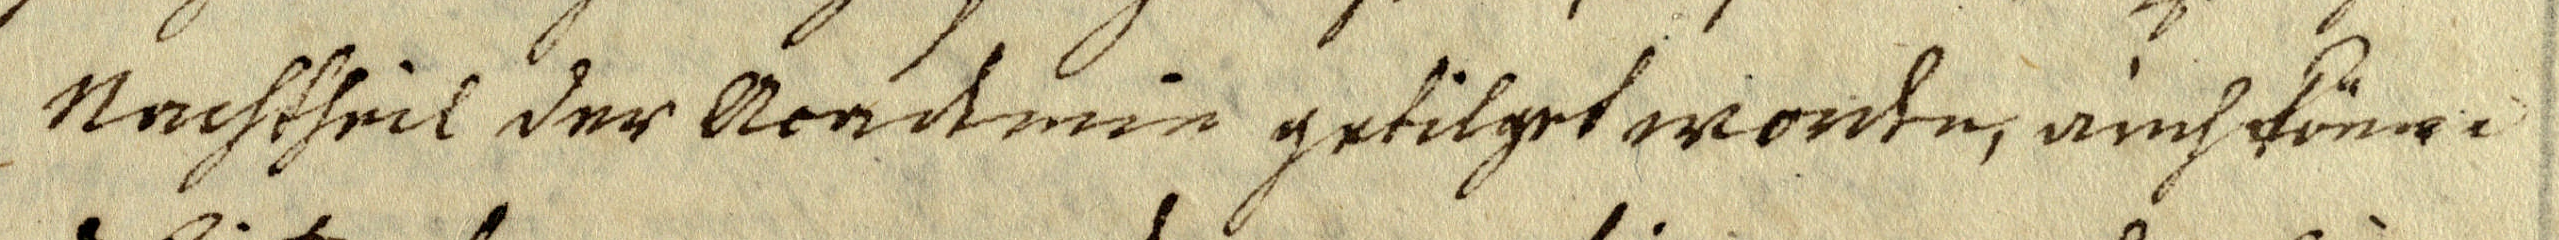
Nachtheil der Academie getilget worden, auch könne
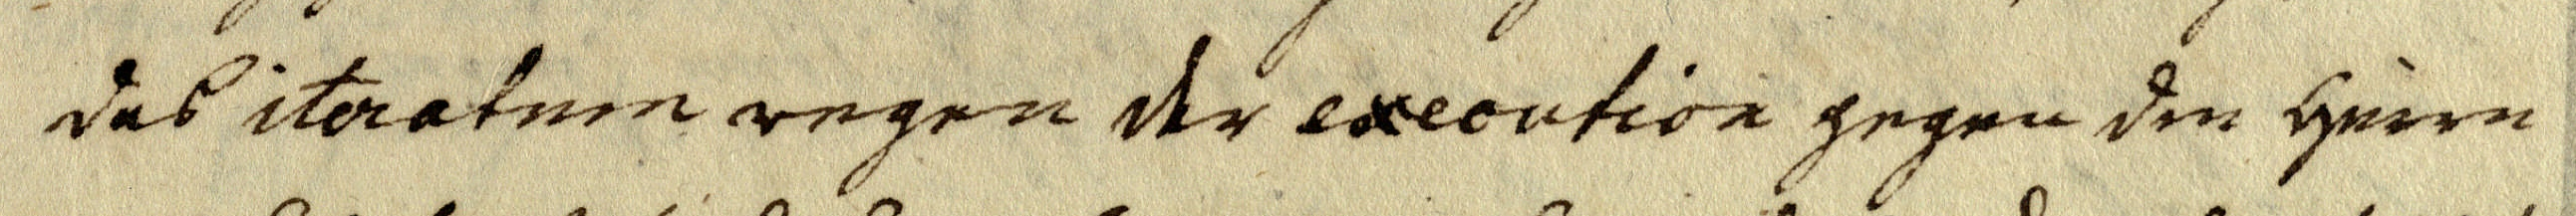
das iteratum wegen der execution gegen den Herrn
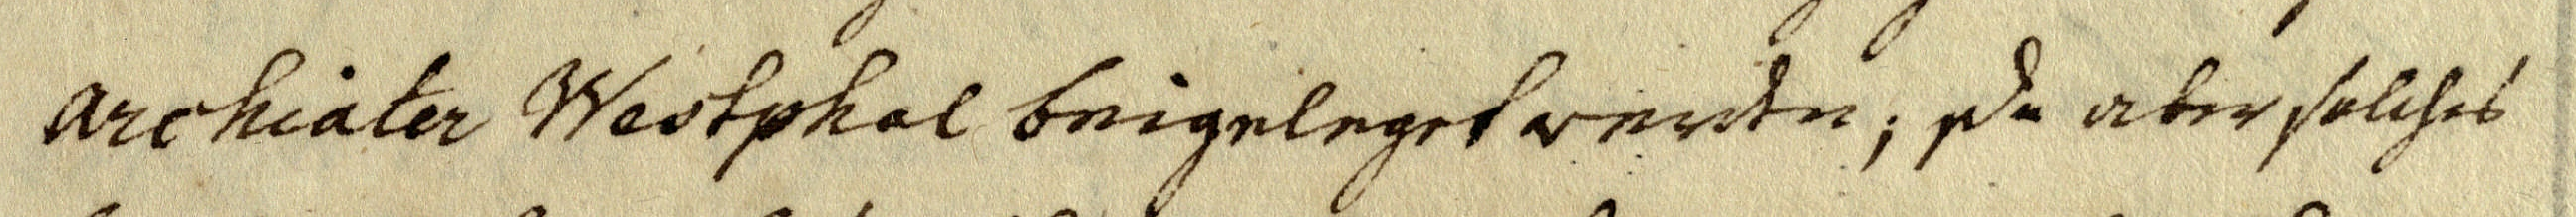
Archiater Westphal beigeleget werden; da aber solches
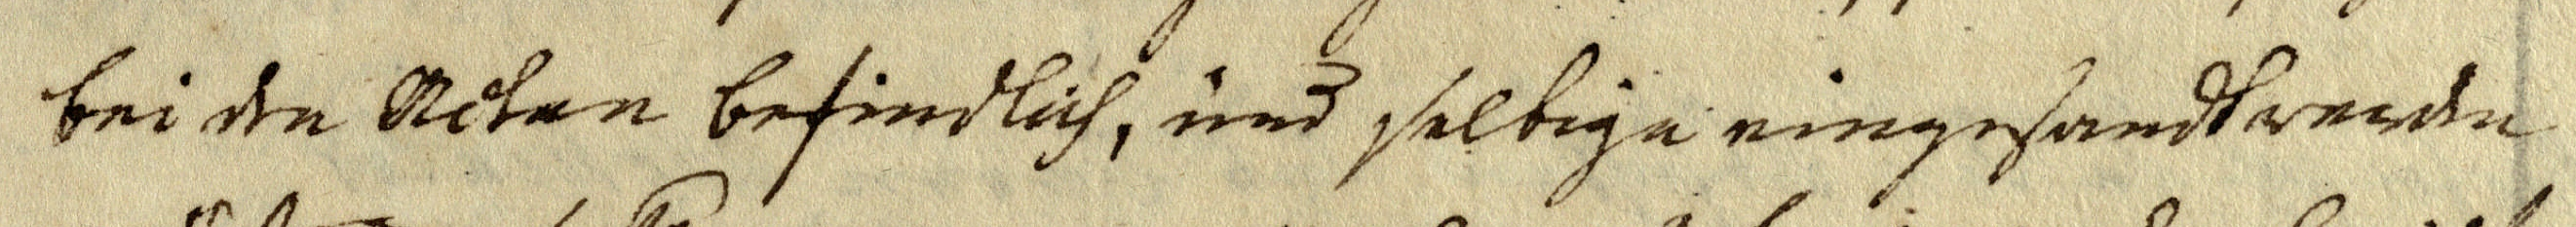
bei den Acten befindlich, und selbige eingesandt werden
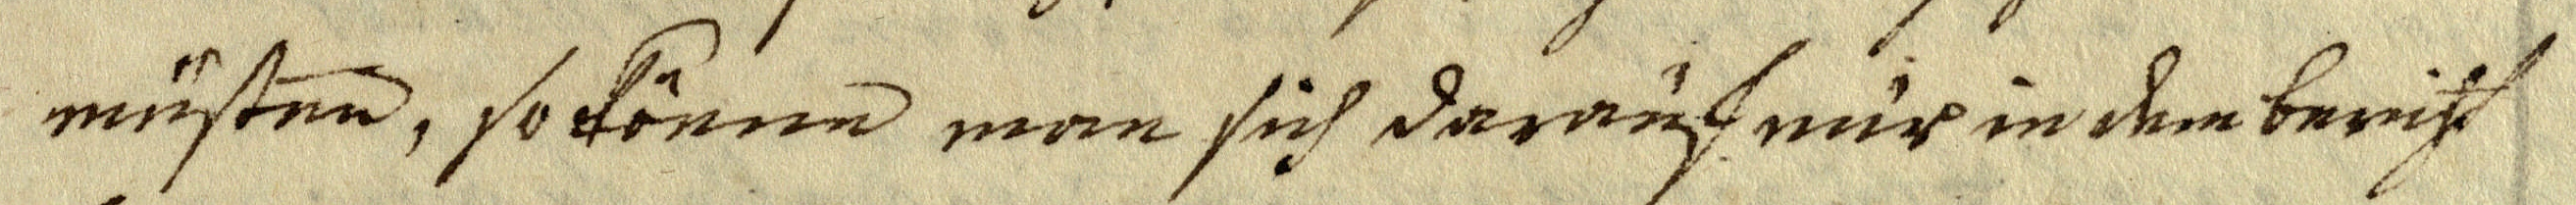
müsten, so könne man sich darauf nur in dem Bericht
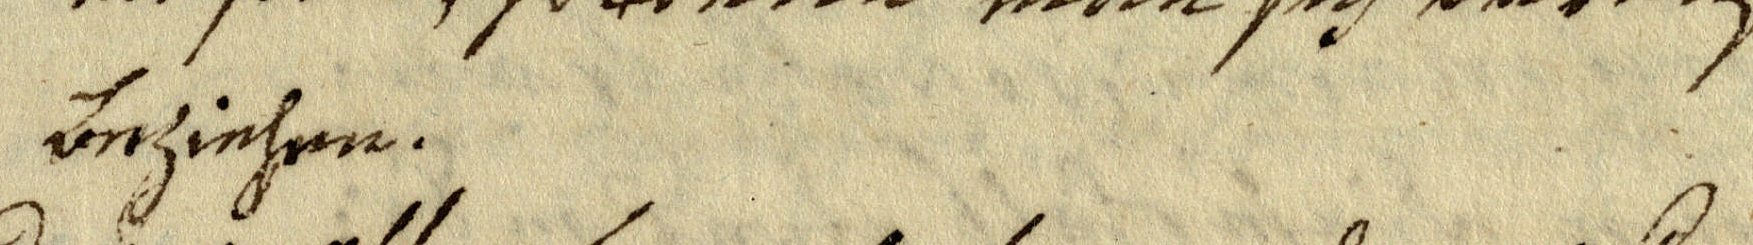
beziehen.
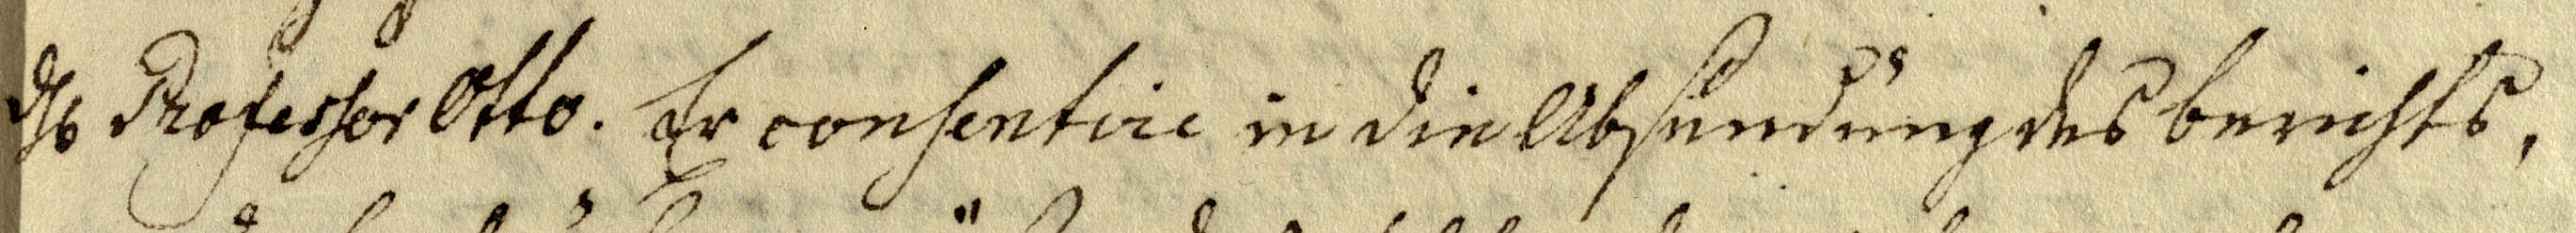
dh Professor Otto. Er consentire in die Absendung des Berichts,
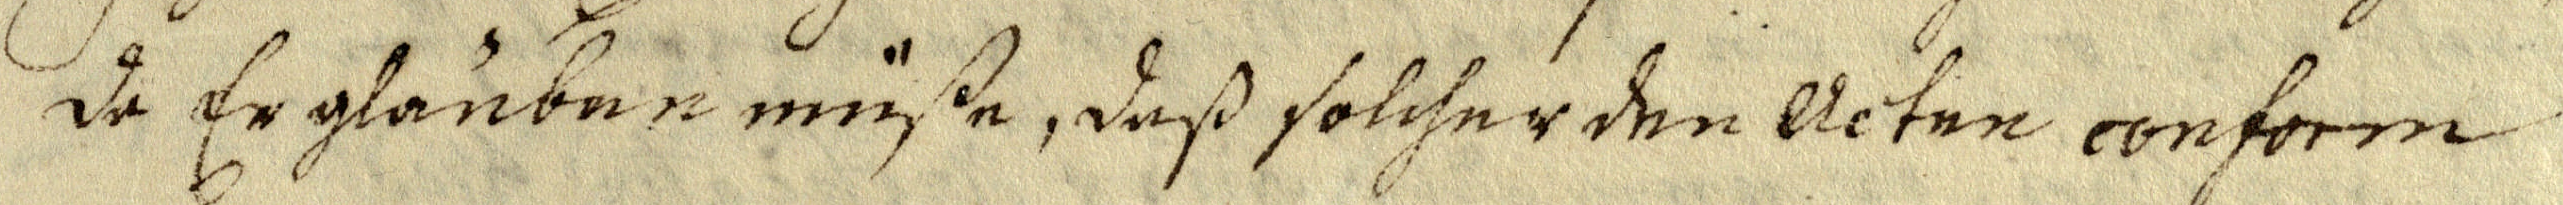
da Er glauben müße, daß solcher den Acten conform
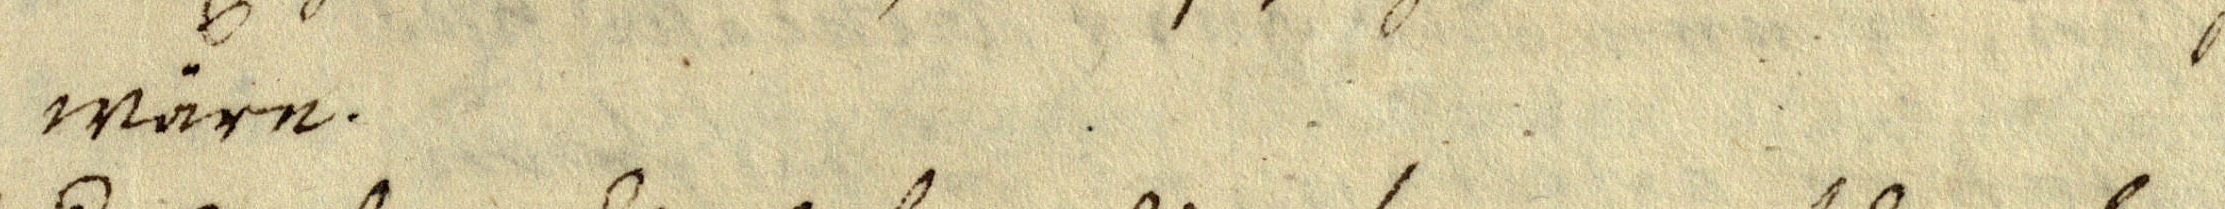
wäre.
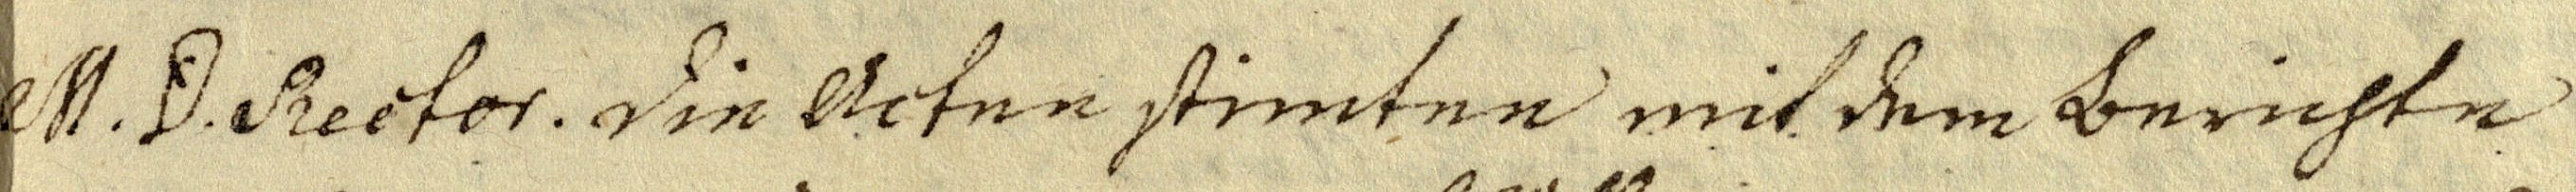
M. D. Rector. Die Acten stimten mit dem Berichte
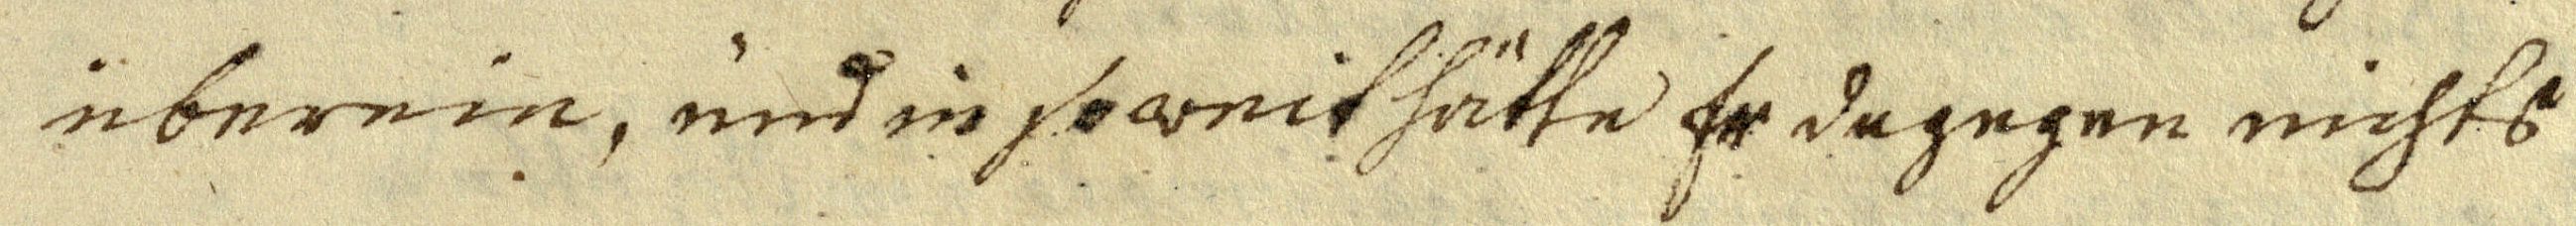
überein, und in soweit hätte Er dagegen nichts
